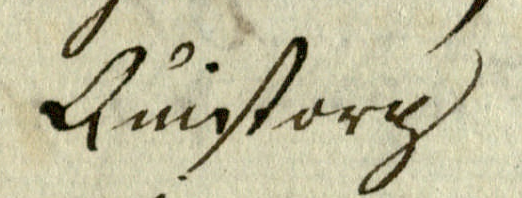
Quistorp,
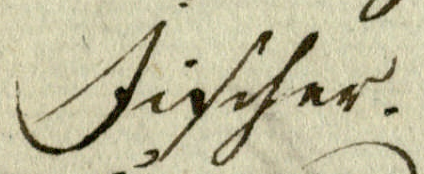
Fischer.
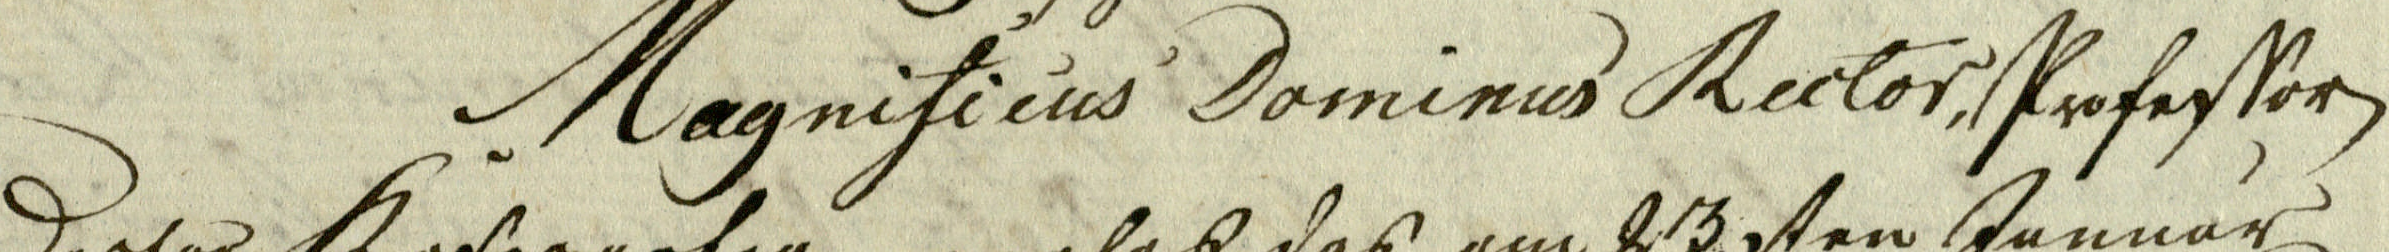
Magnificus Dominus Rector, Professor
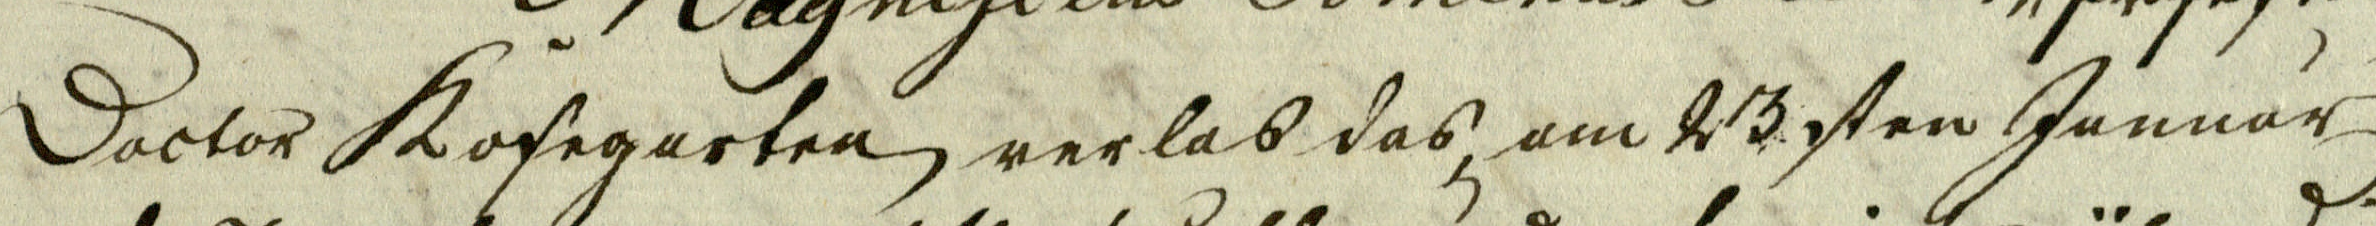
Doctor Kosegarten verlas das am 23sten Januar
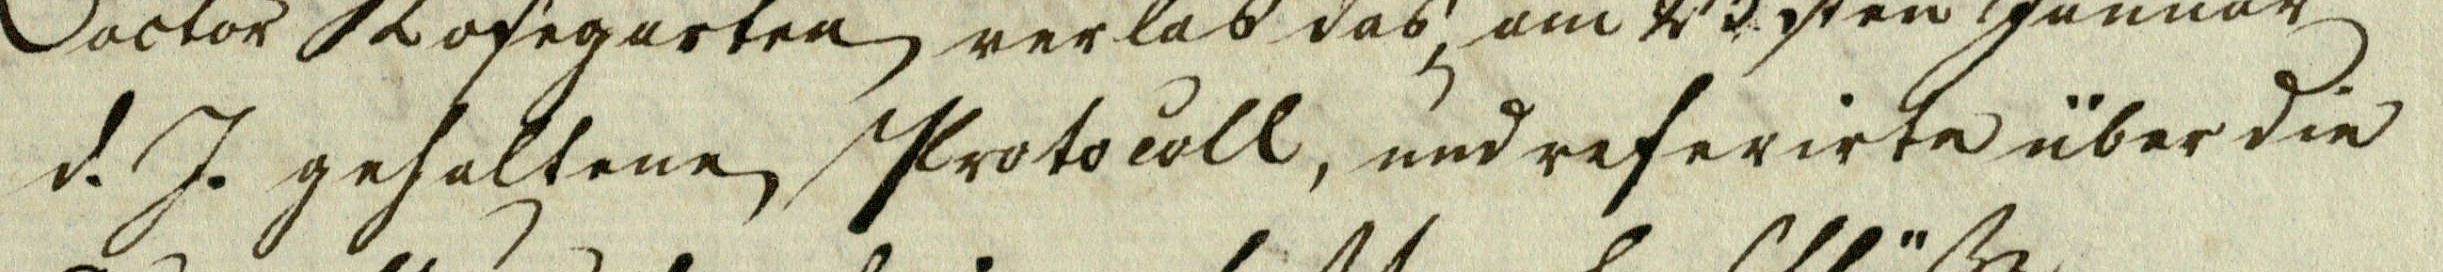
d. J. gehaltene Protocoll, und referirte über die
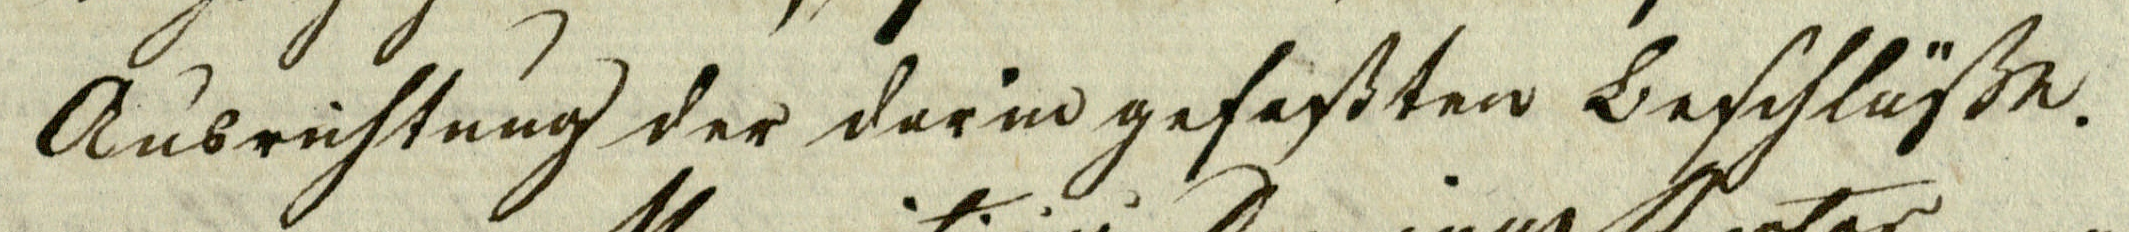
Ausrichtung der darin gefaßten Beschlüße.
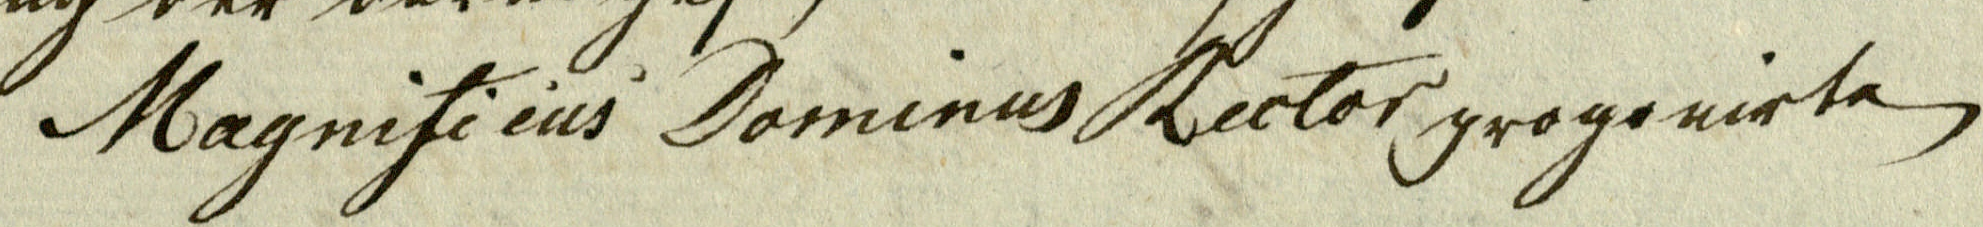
Magnificus Dominus Rector proponirte
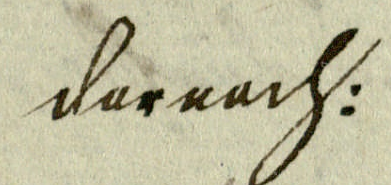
darnach:
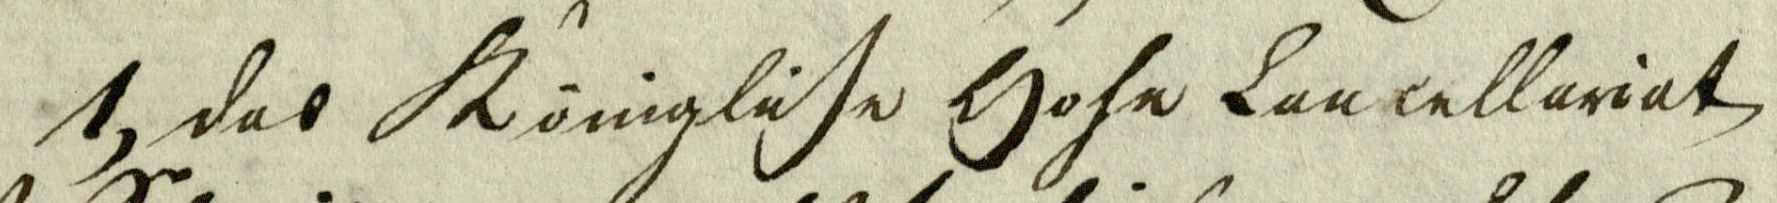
1, das Königliche Hohe Cancellariat
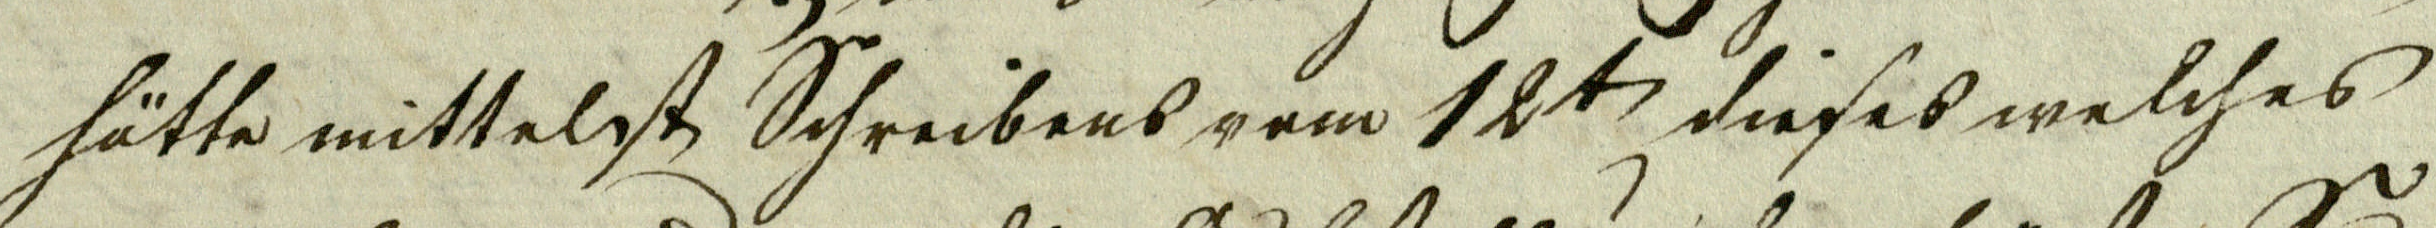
hätte mittelst Schreibens vom 12ten dieses welches
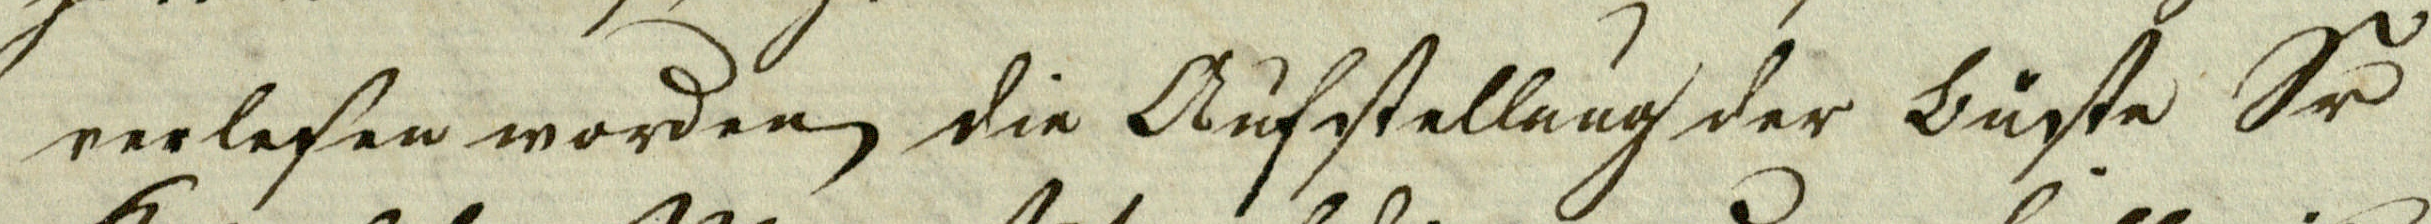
verlesen worden, die Aufstellung der Büste Sr
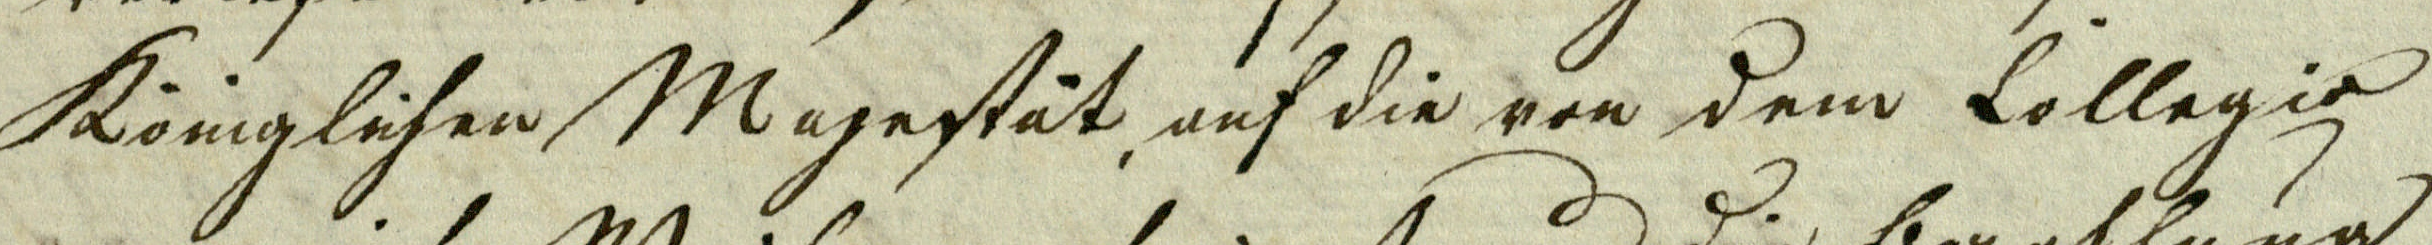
Königlichen Majestät auf die von dem Collegio
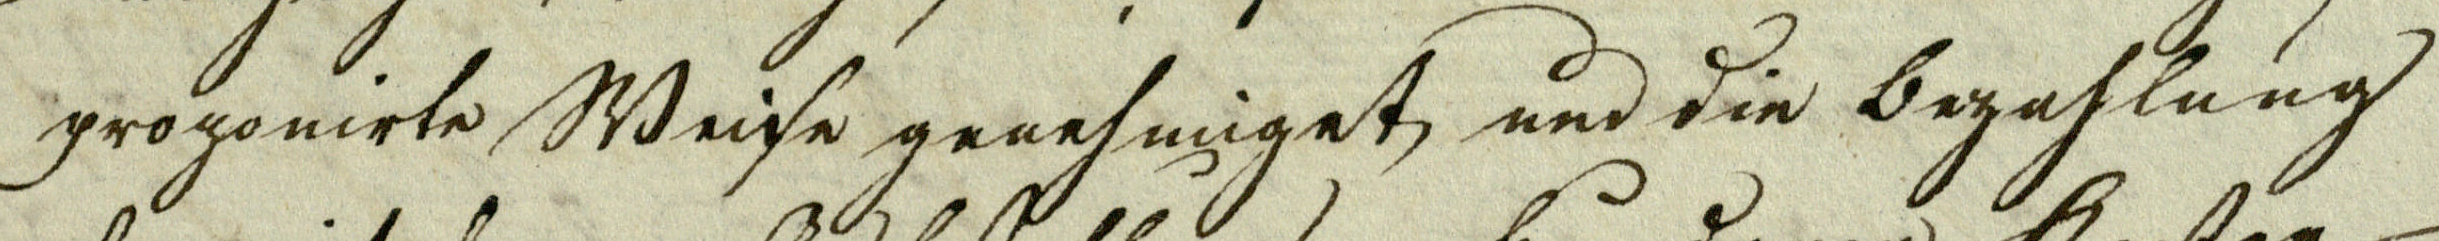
proponirte Weise genehmiget, und die Bezahlung
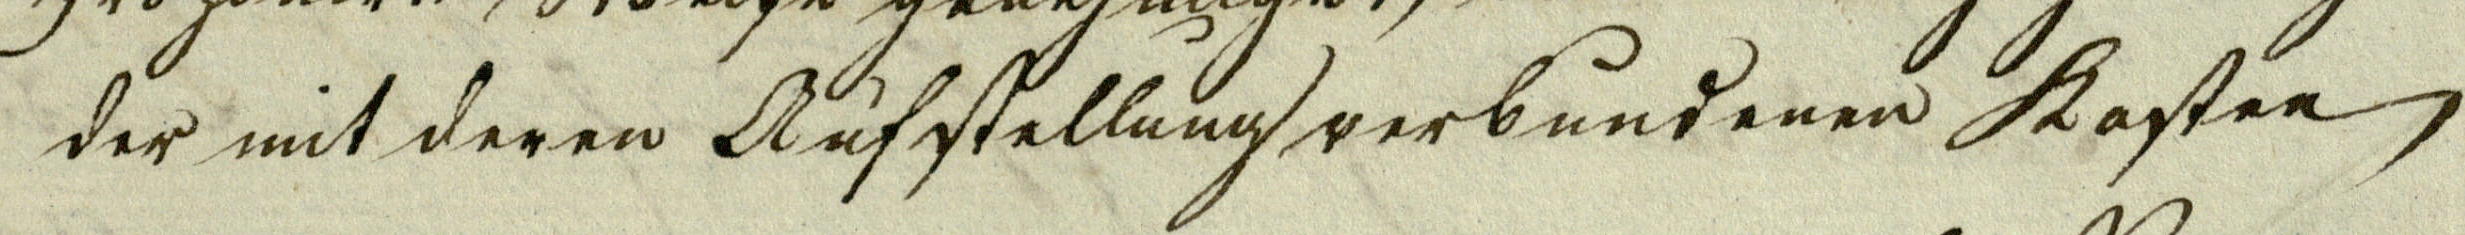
der mit deren Aufstellung verbundenen Kosten
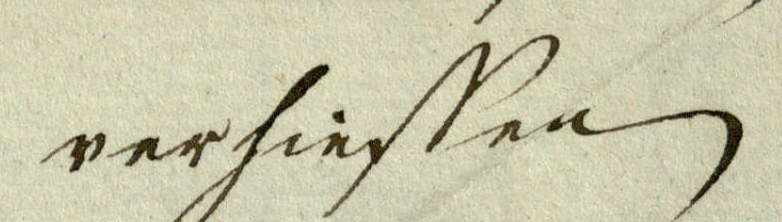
verhiessen
